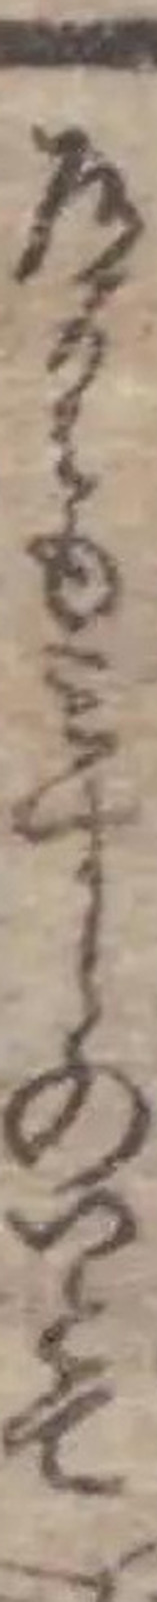道具もミすしのいとて
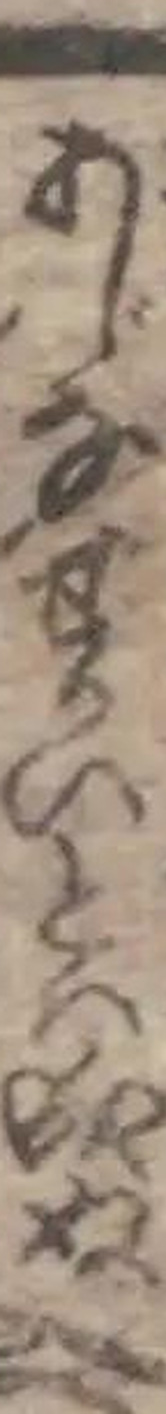あじなせかいとハ成ぬ
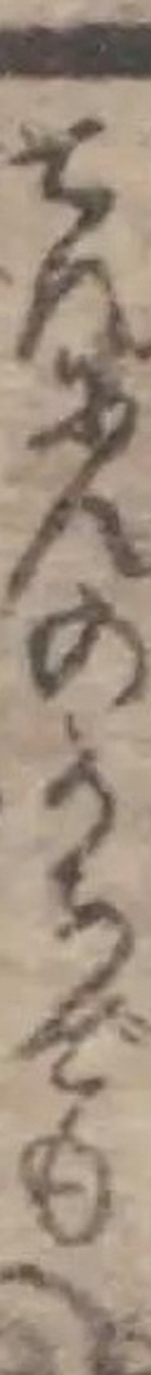てんにんのうちでも
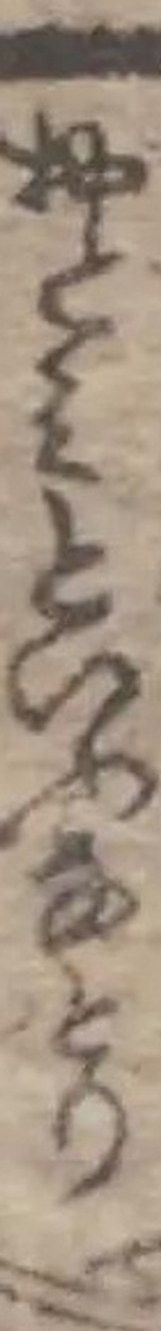おとミといふなとり
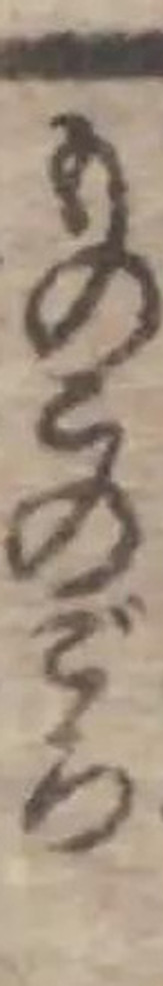ものこのごろ
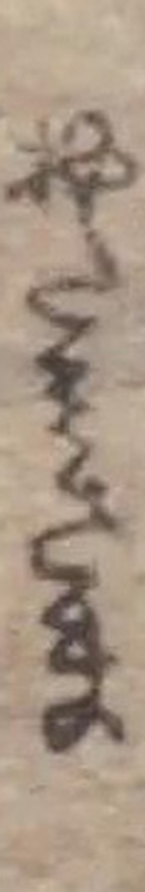おたミさま
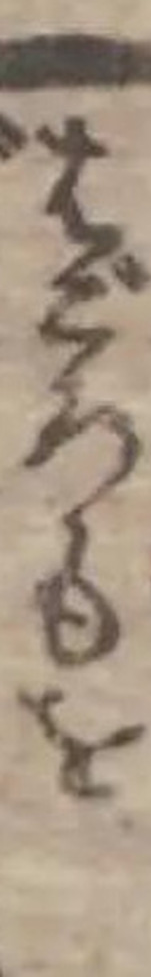はごろもを
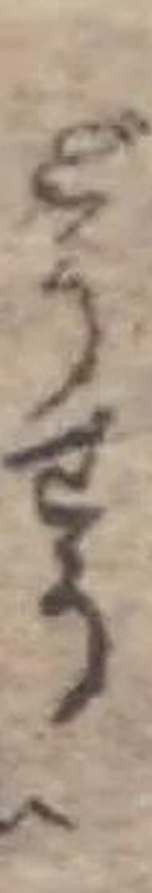どうせう
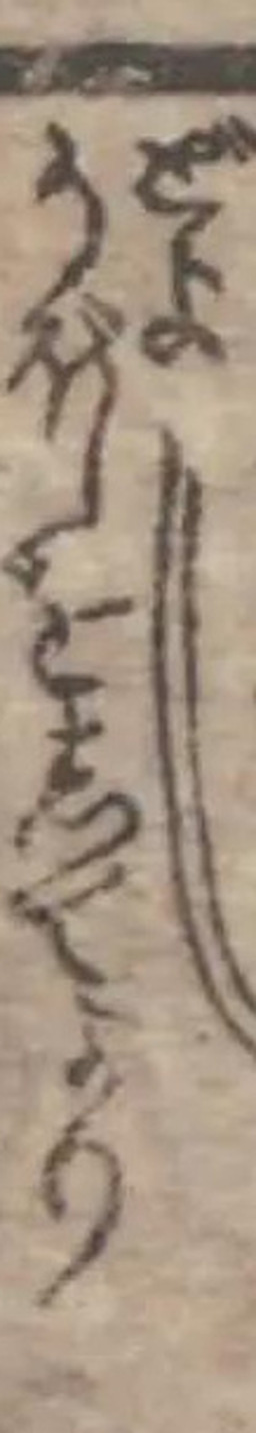うぼしをしてより
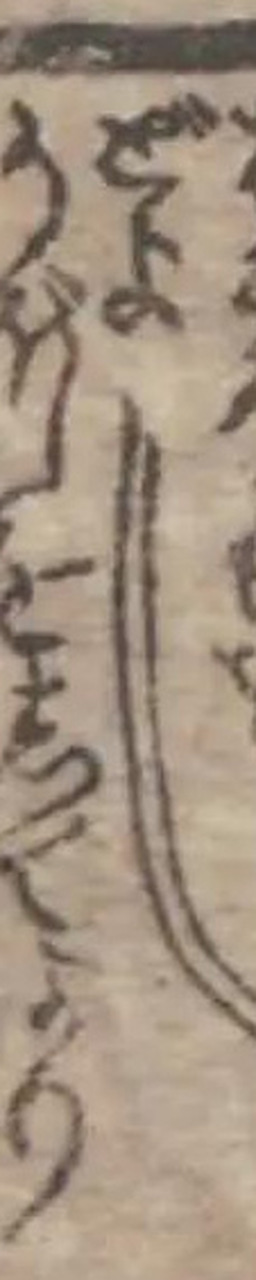うぼしをしてより
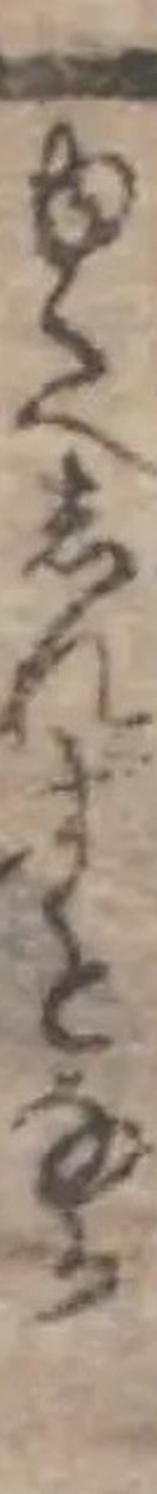ゆくへしれずとなか
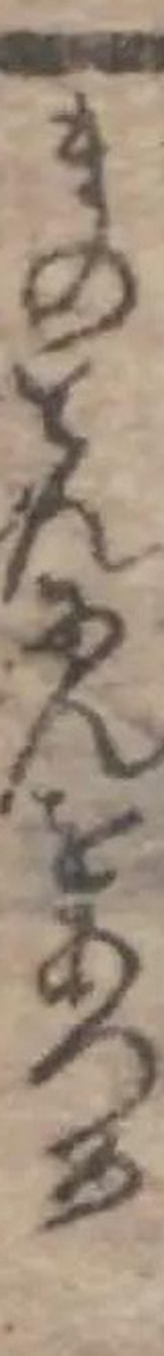まのてんにんをあつめ
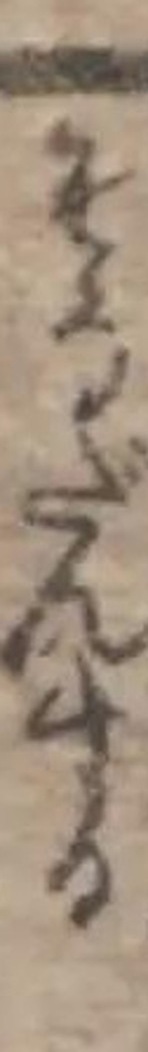そうだんする
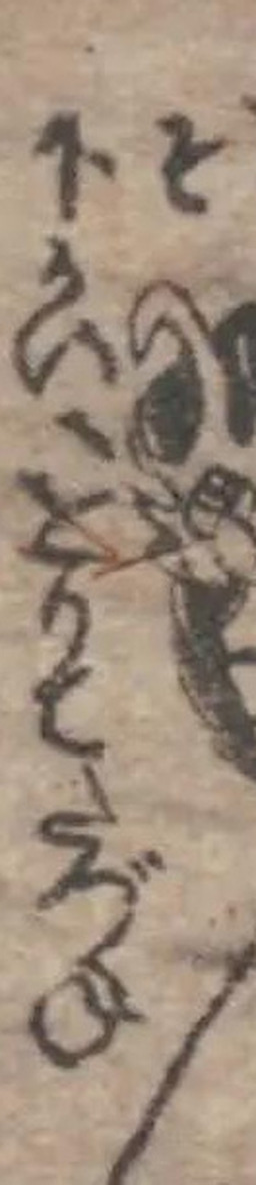下かいへをりてたづね
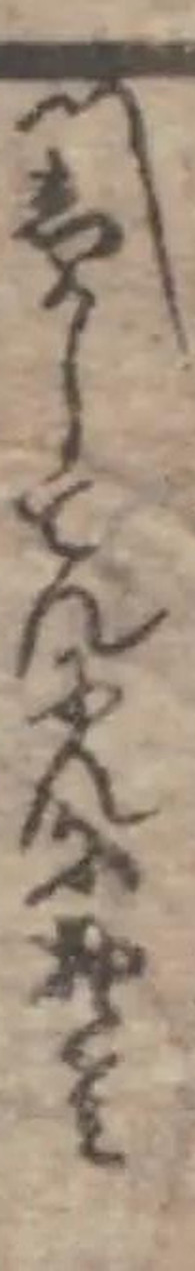「しかしてんにんにおとミ
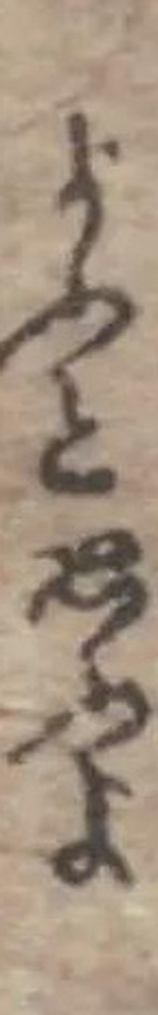よふと思ふよ
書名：草紙の曙 3巻
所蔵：国立国会図書館 National Diet Library, JAPAN
